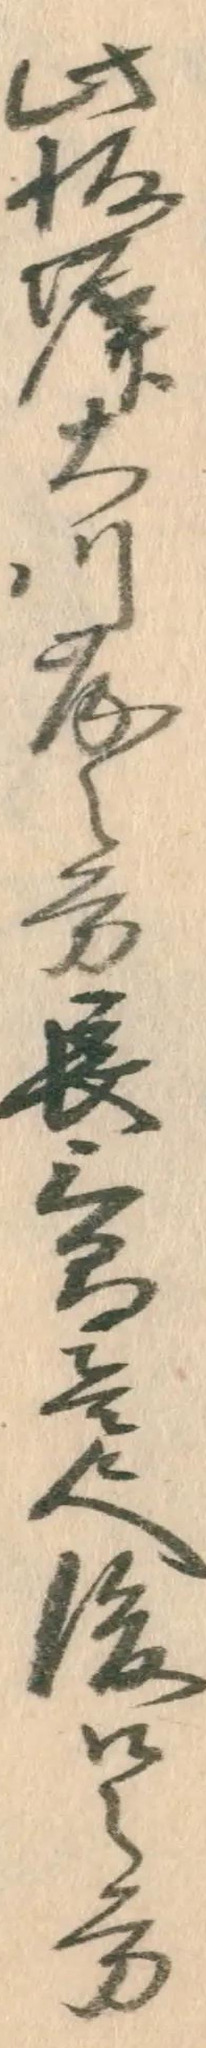此板塀大川岸之方長三間壱尺後口之方
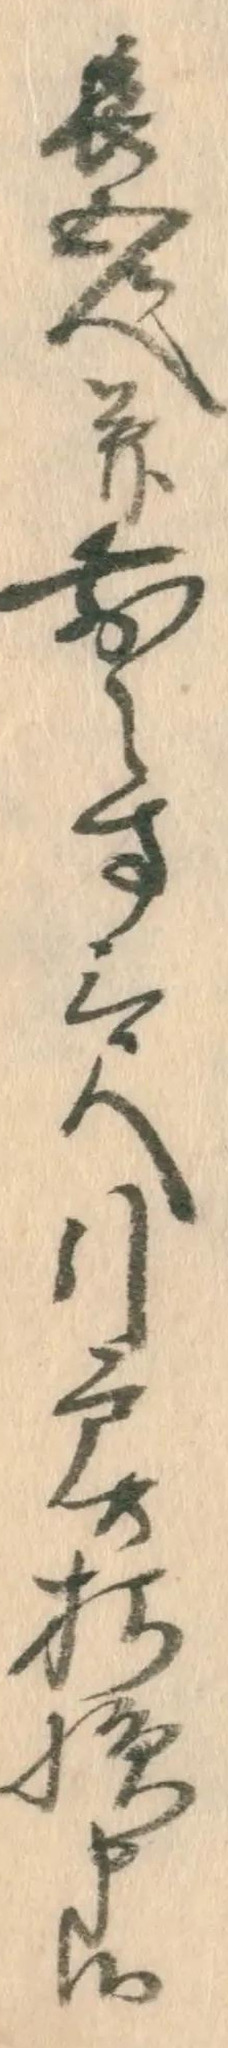長五尺并前之方三尺引戸共朽損申候

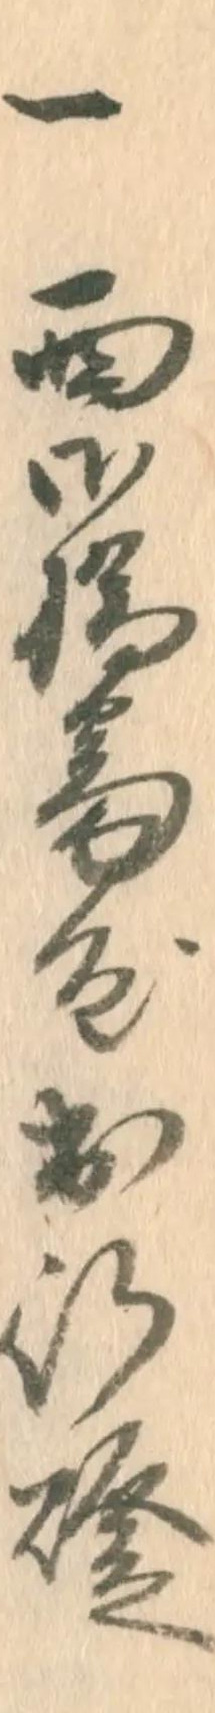一西御橋番屋出行灯
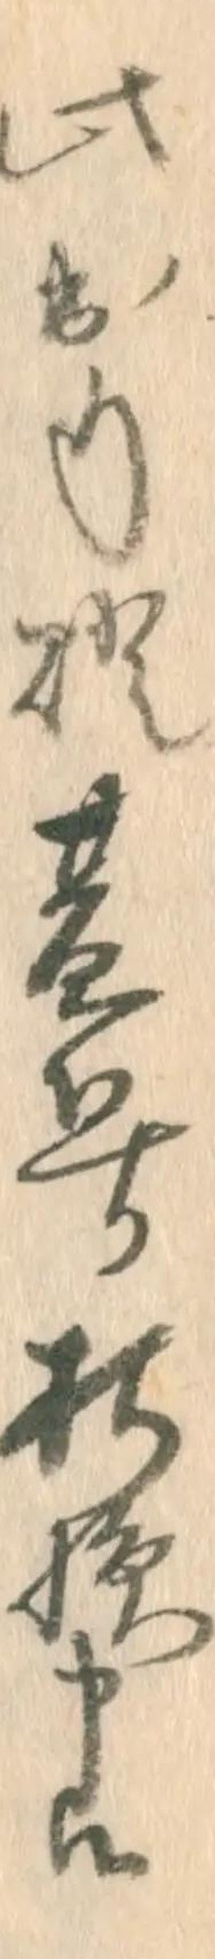此出行灯台廻り朽損申候
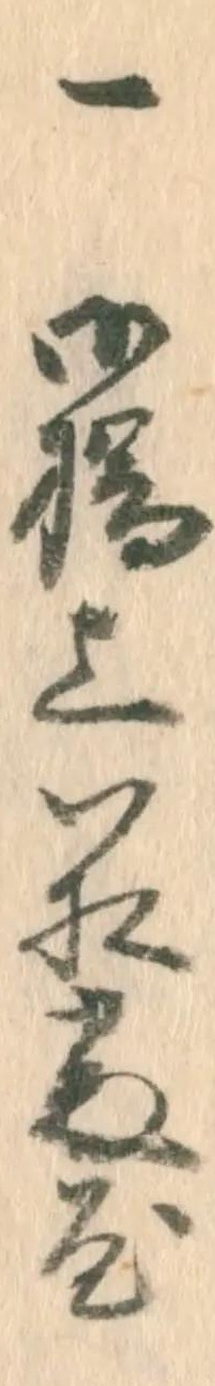一御橋上箱番屋
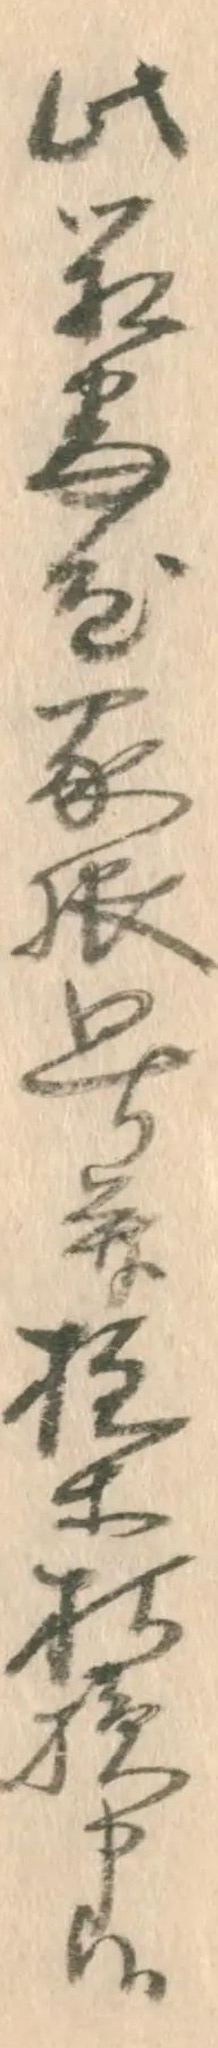此箱番屋家根廻り并柱木朽損申候
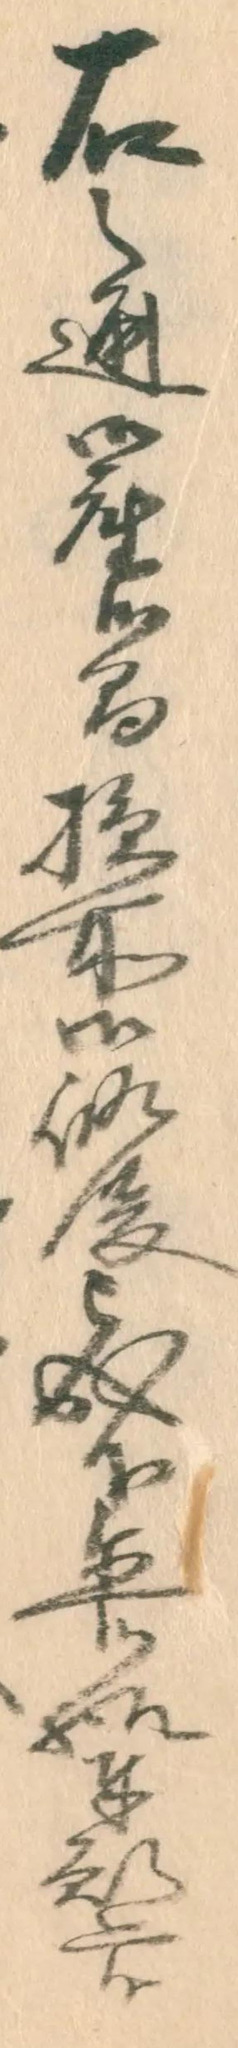右之通御座候間損所御修復被成下置候様奉願上候
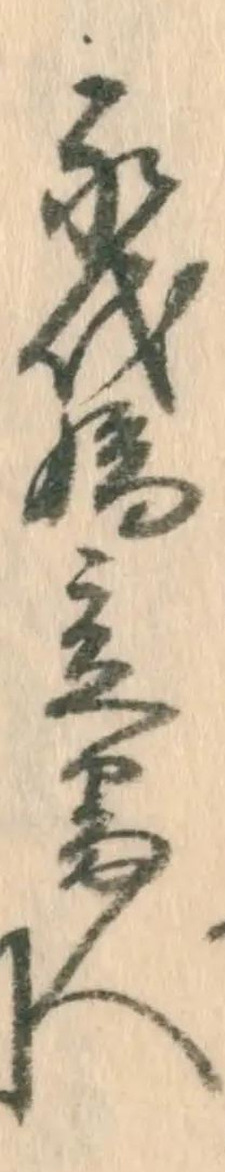永代橋定番人
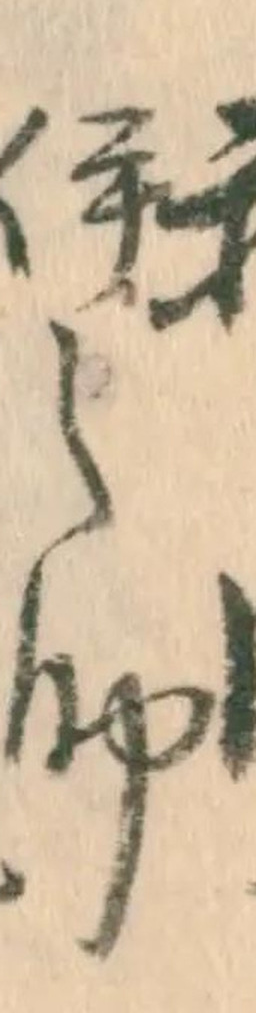伊之助
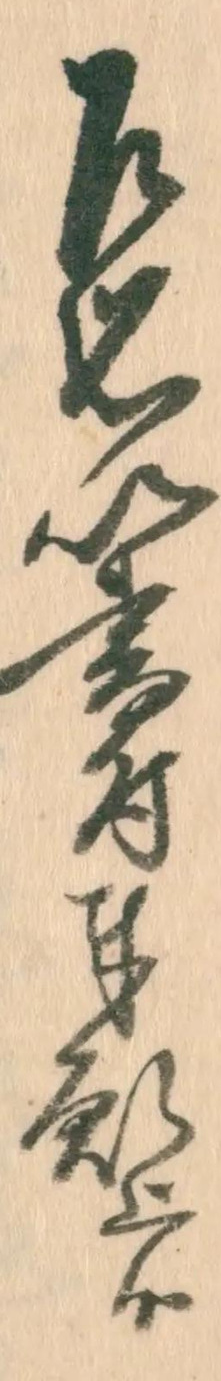乍恐以書付奉願上候
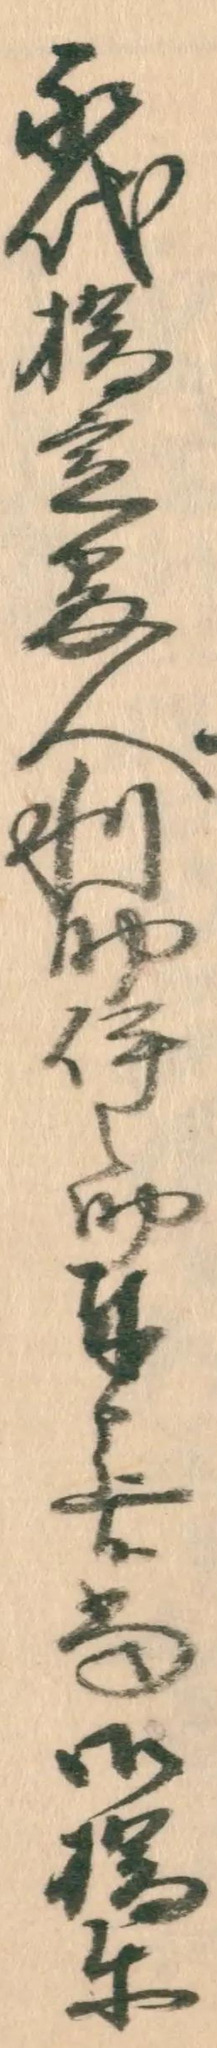一永代橋定番人利助伊之助奉申上候当御橋東
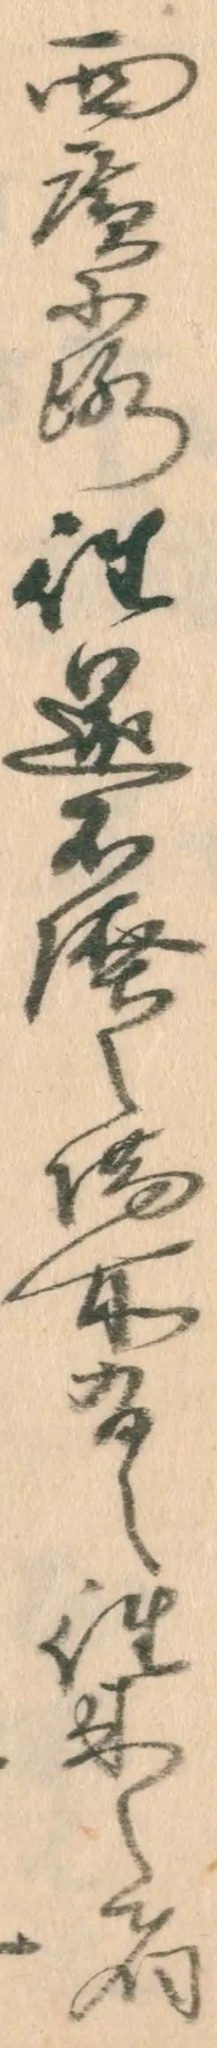西広小路往還不陸之場所有之往来之者
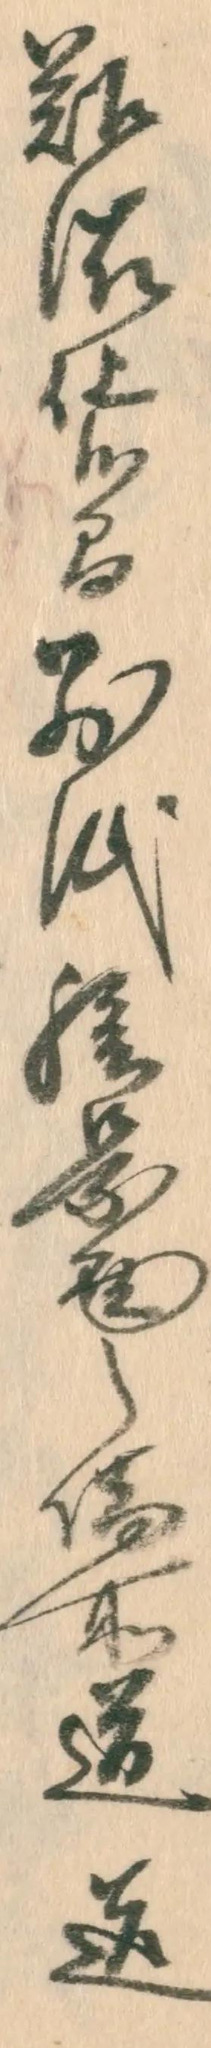難渋仕候間別紙絵図面之場所道造
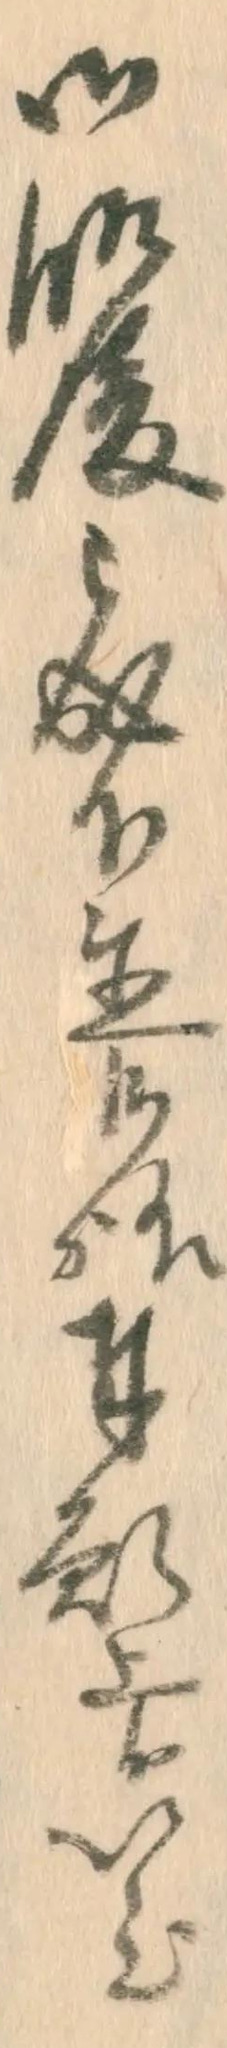御修復被成下置候様奉願上候以上
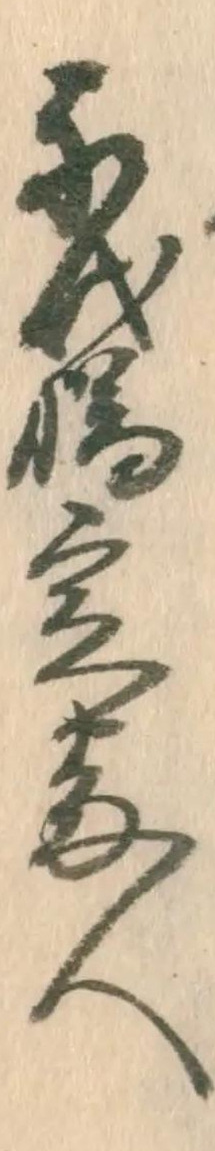永代橋定番人
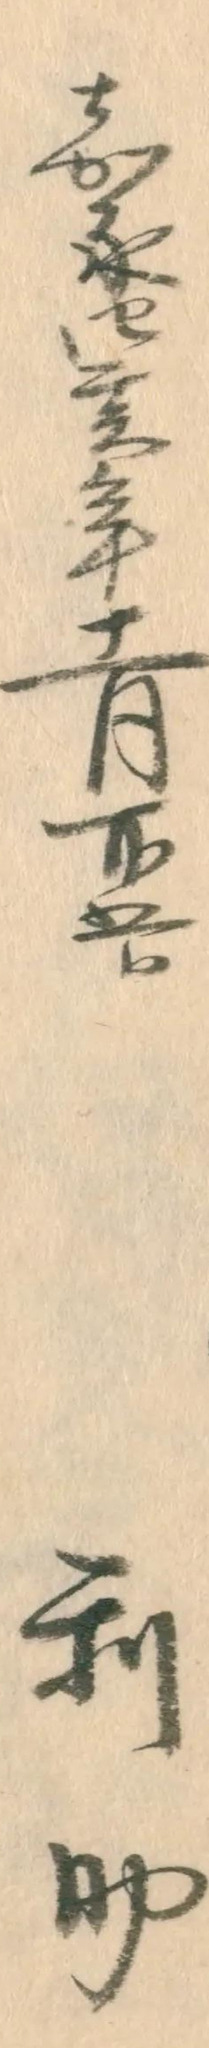嘉永四亥年十一月廿五日利助
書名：三橋 17巻. [7] 三橋小破御修復書留　但御奉行御掛リ替地震潰橋番屋　嘉永四亥年より安政二卯年迄　上
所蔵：国立国会図書館 National Diet Library, JAPAN
